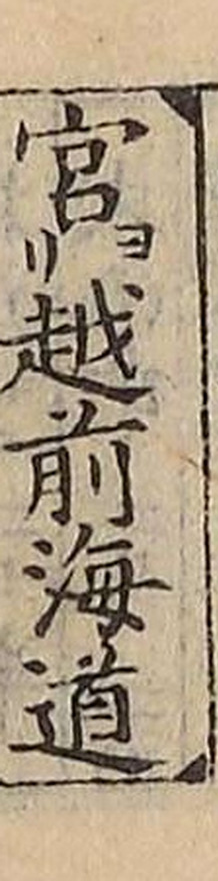宮ヨリ越前海道
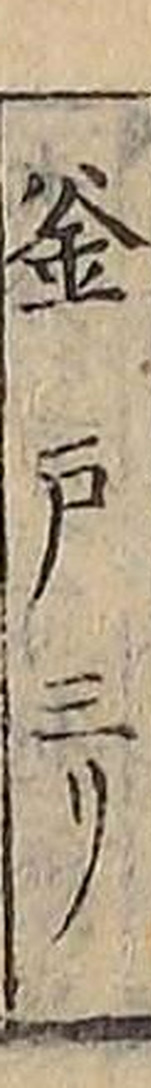釜戸三リ
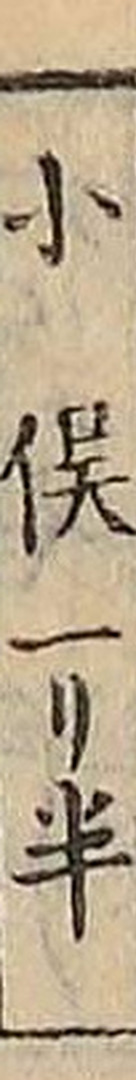小俣一リ半
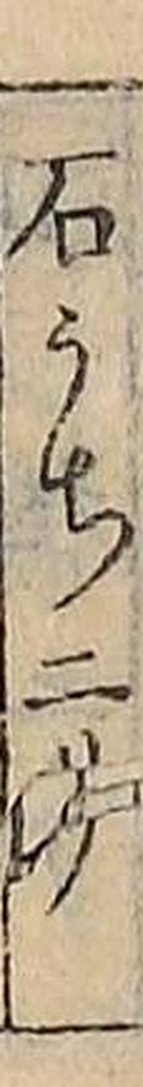石うち二リ
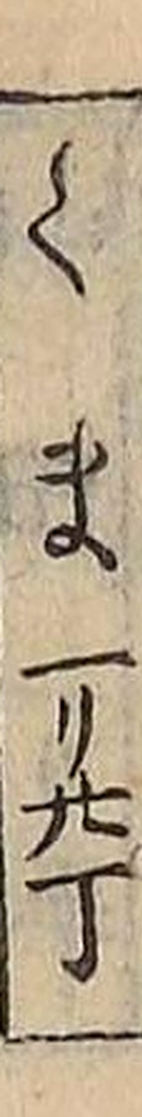くま一リ廿丁
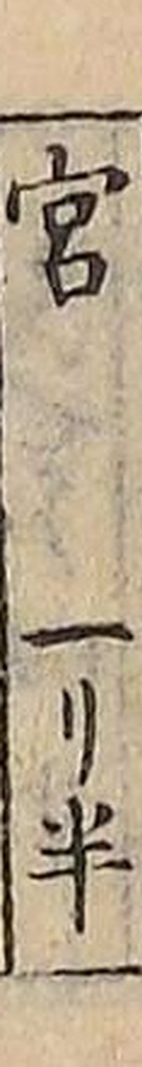宮一リ半
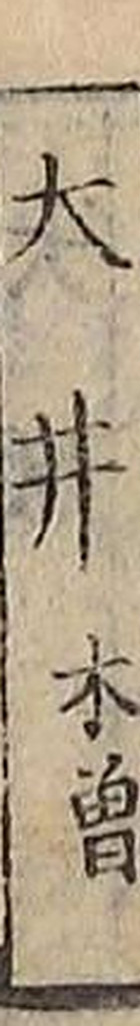大井木曽
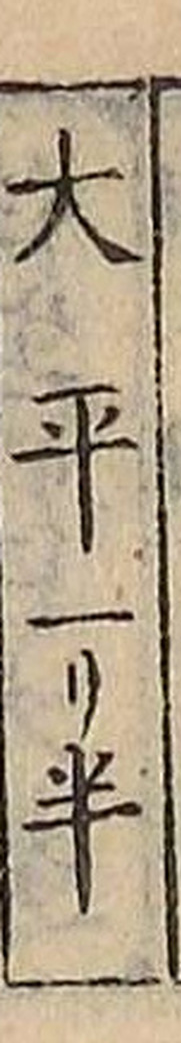大平一リ半
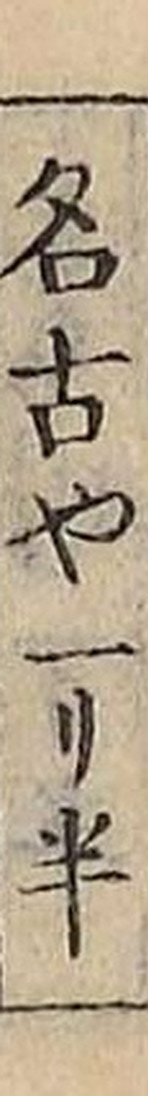名古や一リ半
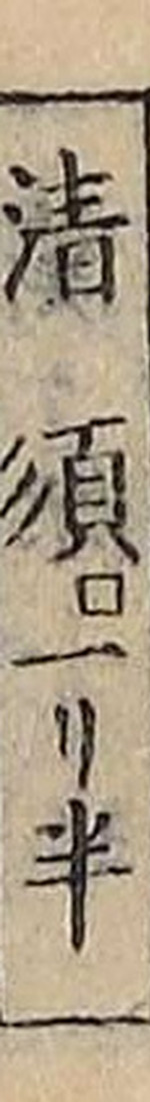清須▫一リ半
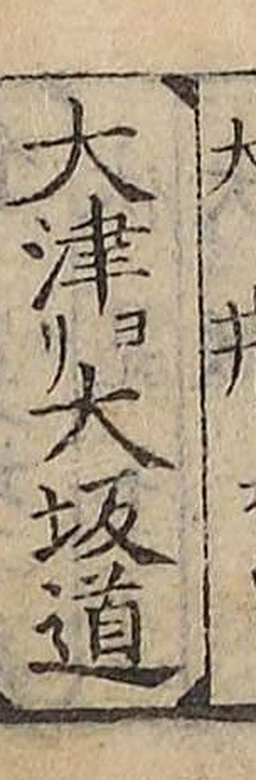大津ヨリ大坂道
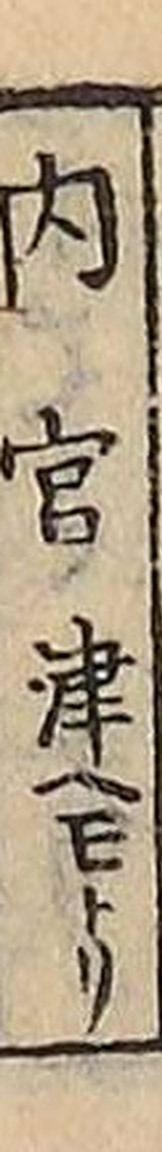内宮津へモトリり
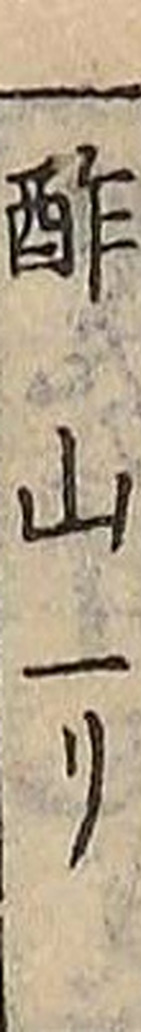酢山一リ
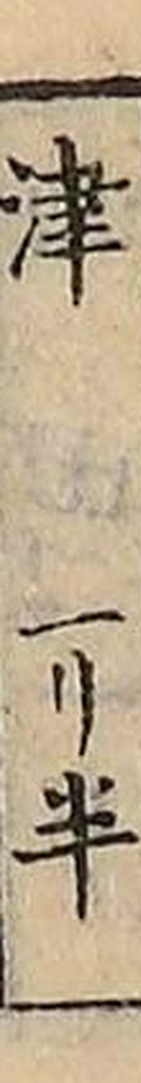津一リ半
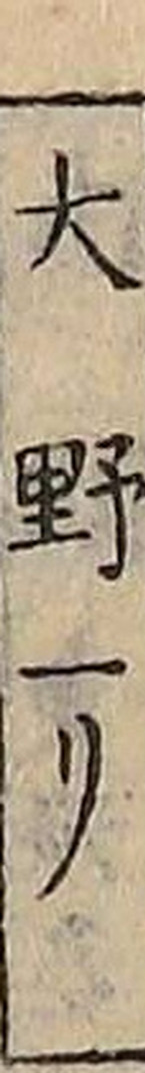大野一リ
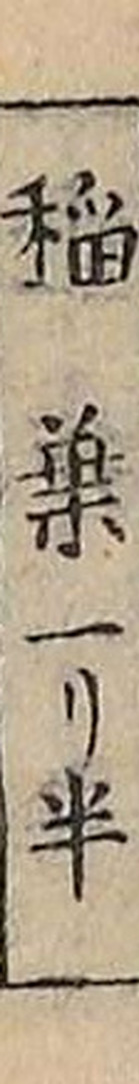稲葉一リ半
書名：旅行用心集
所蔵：神戸大学附属図書館 国文学研究資料館
